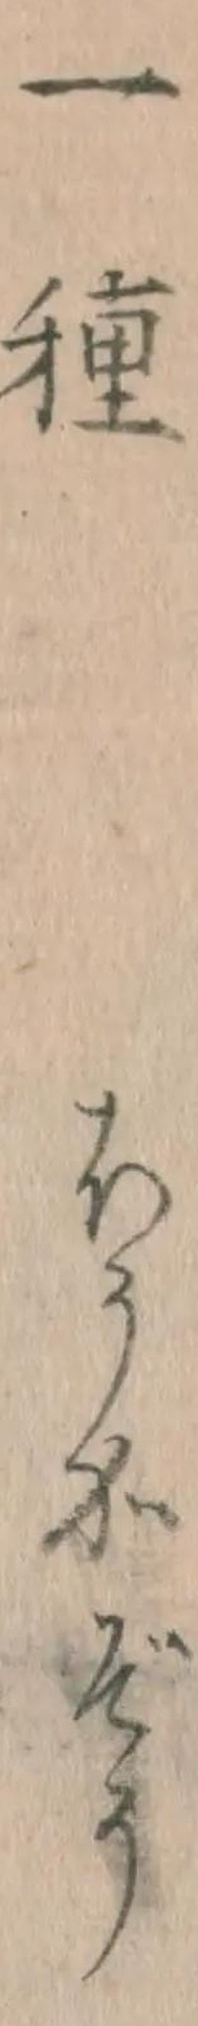一種ほうかぞう
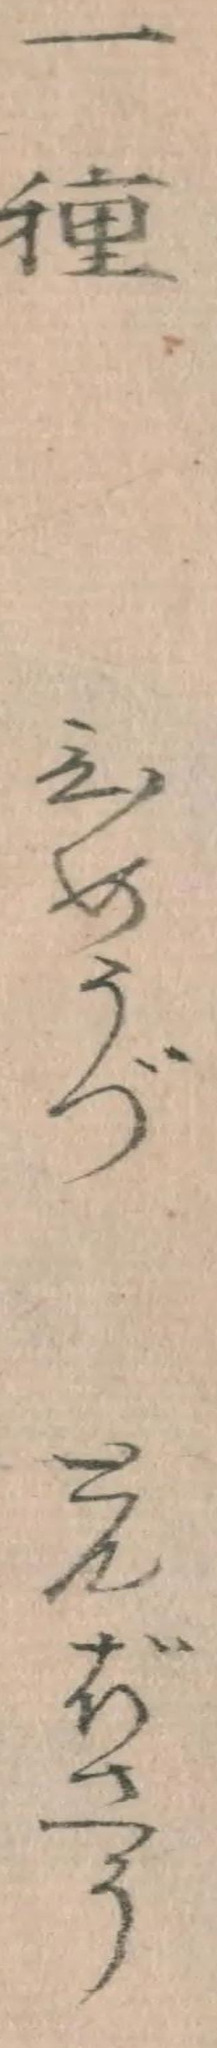一種ひめうづとんぼさう
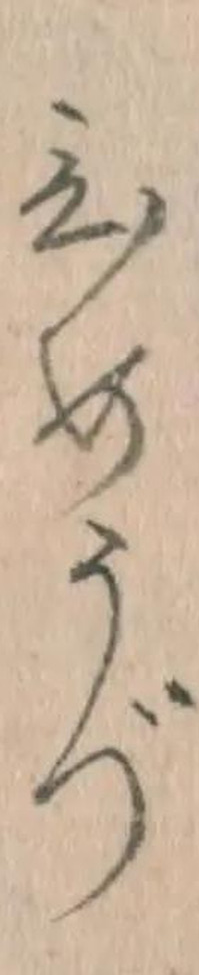ひめうづ
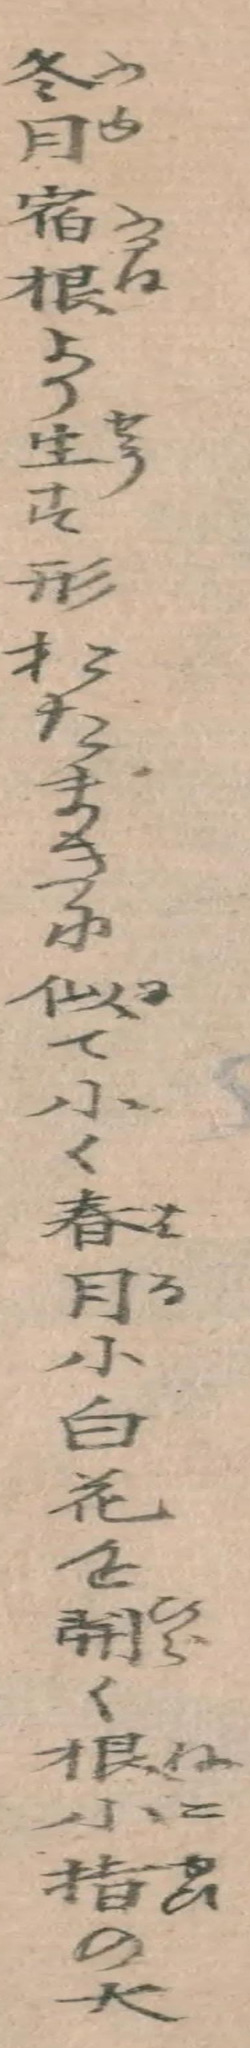冬月宿根より生す形おたまきに似て小く春月小白花を開く根小指の大

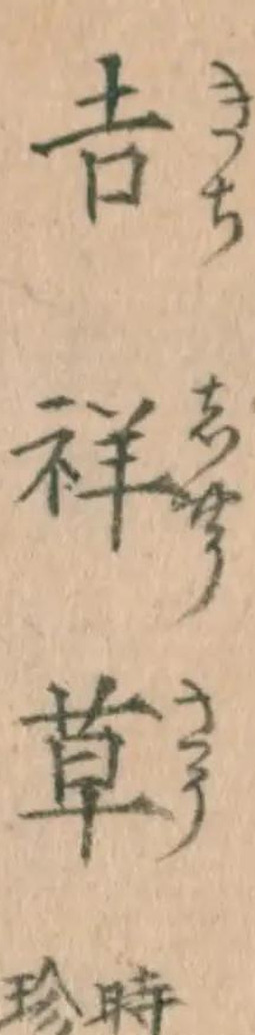吉祥草
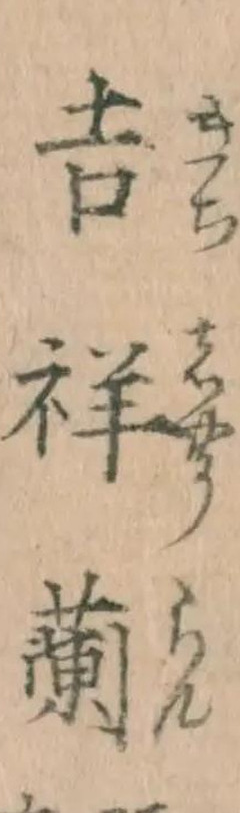吉祥草
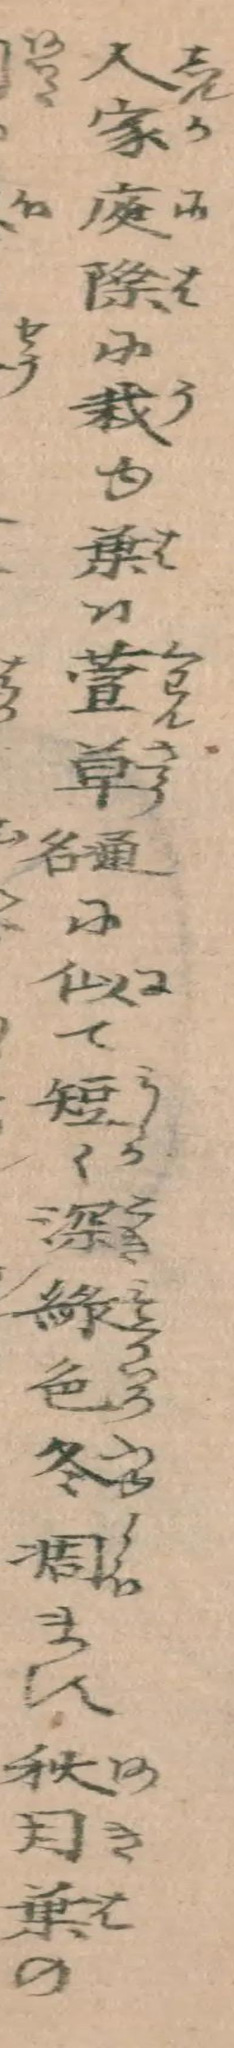人家庭際に栽ゆ葉は萱草通名に似て短く深緑色冬凋ます秋月葉の
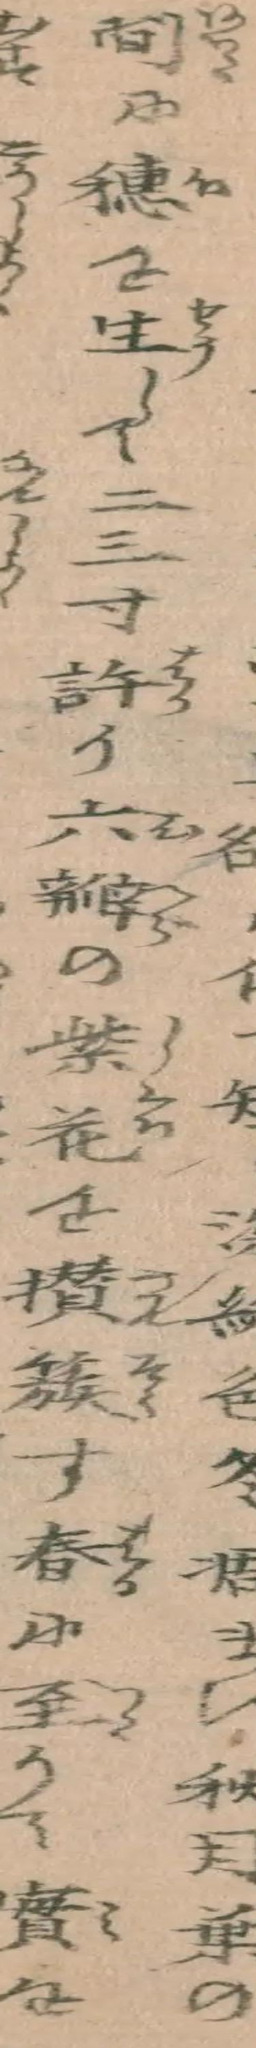間に穂を生して二三寸許り六弁の紫花を攢簇す春に至りて実を
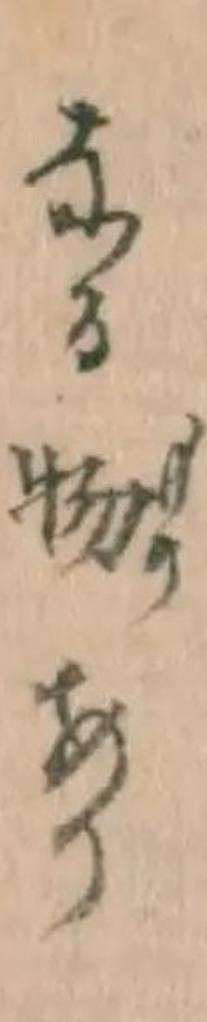なる物あり
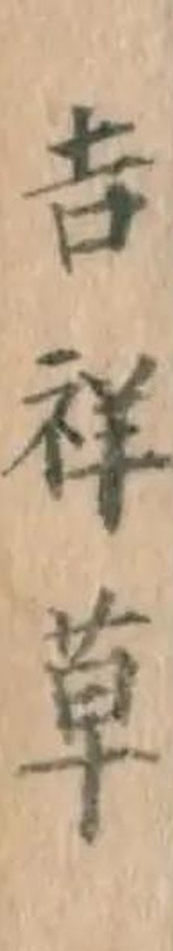吉祥草

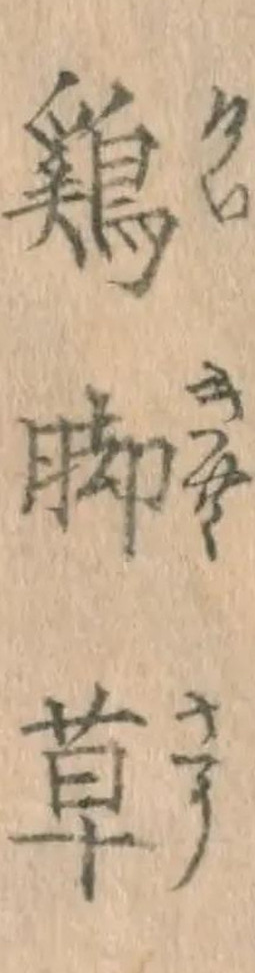鶏脚草
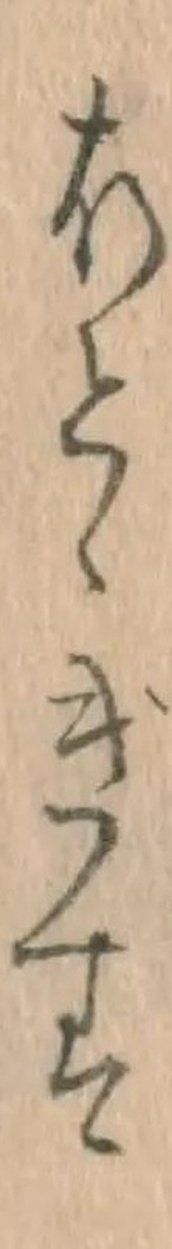ほとゝぎす
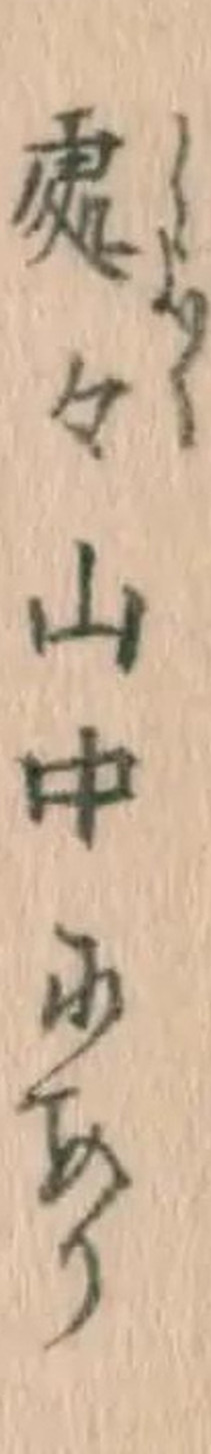処々山中にあり
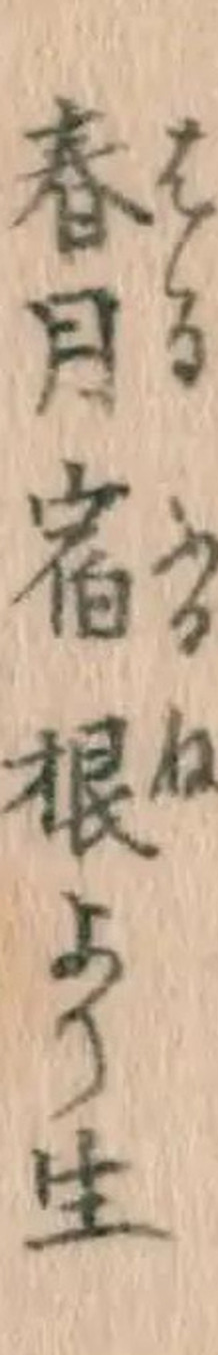春月宿根より生
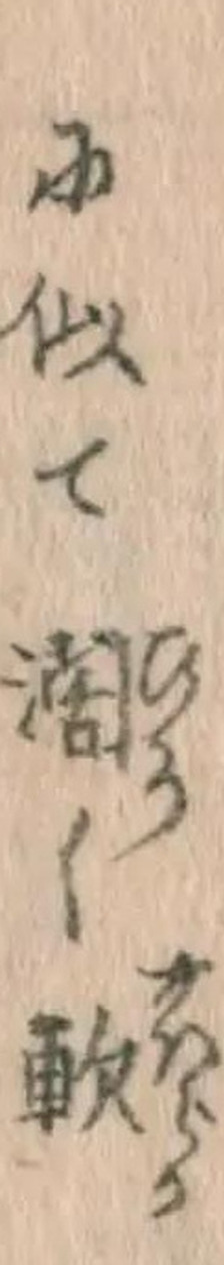に似て闊く軟
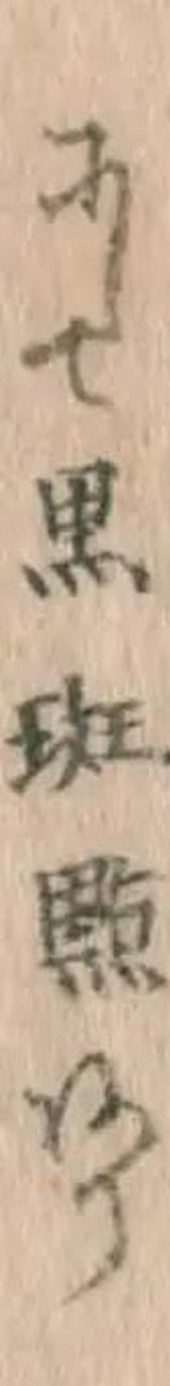にして黒斑点あり
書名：本草図譜. 巻37-39
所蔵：国立国会図書館 National Diet Library, JAPAN
